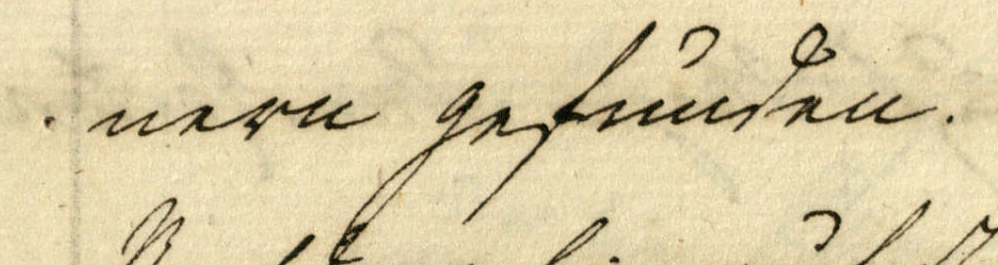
nern gefunden.
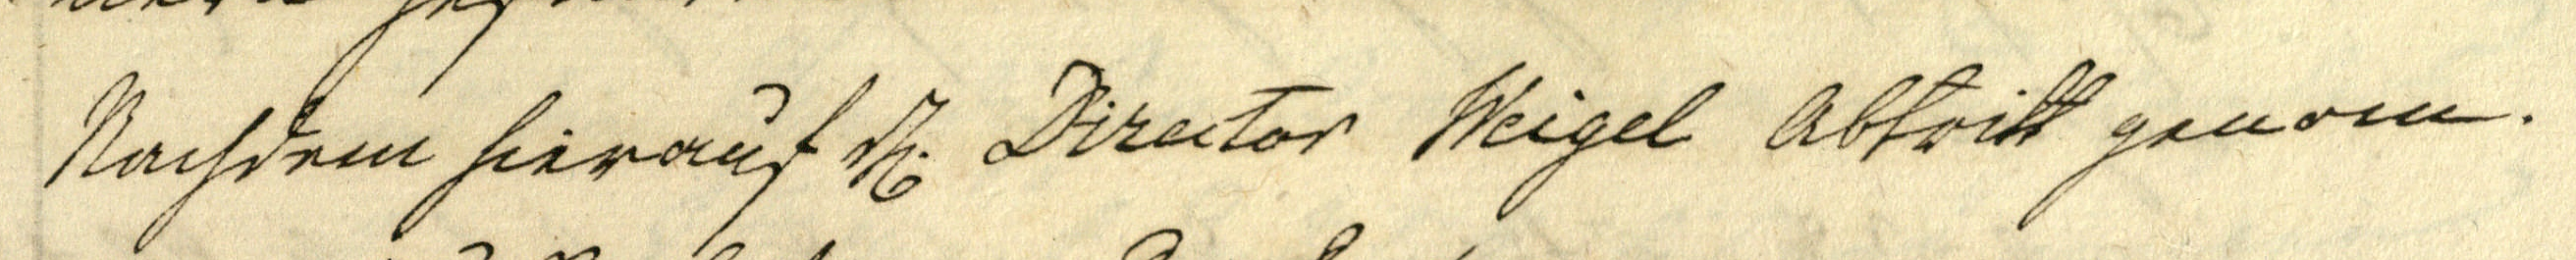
Nachdem hierauf d. h. Director Weigel Abtritt genom-
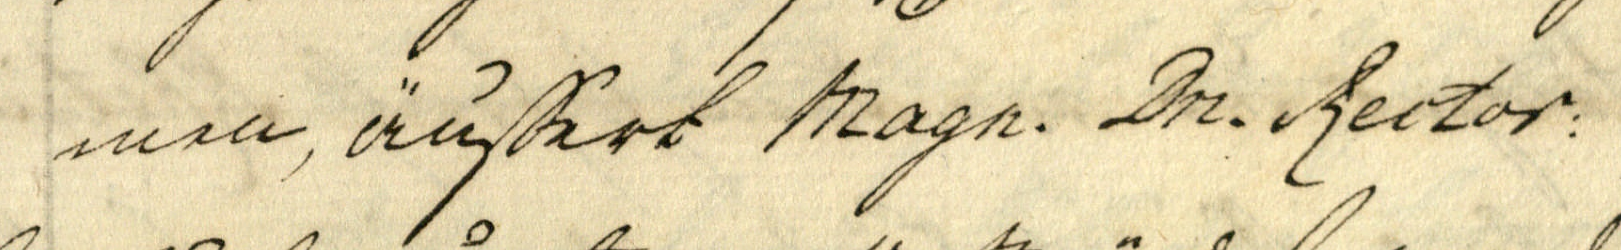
men, äussert Magn. Dn. Rector:
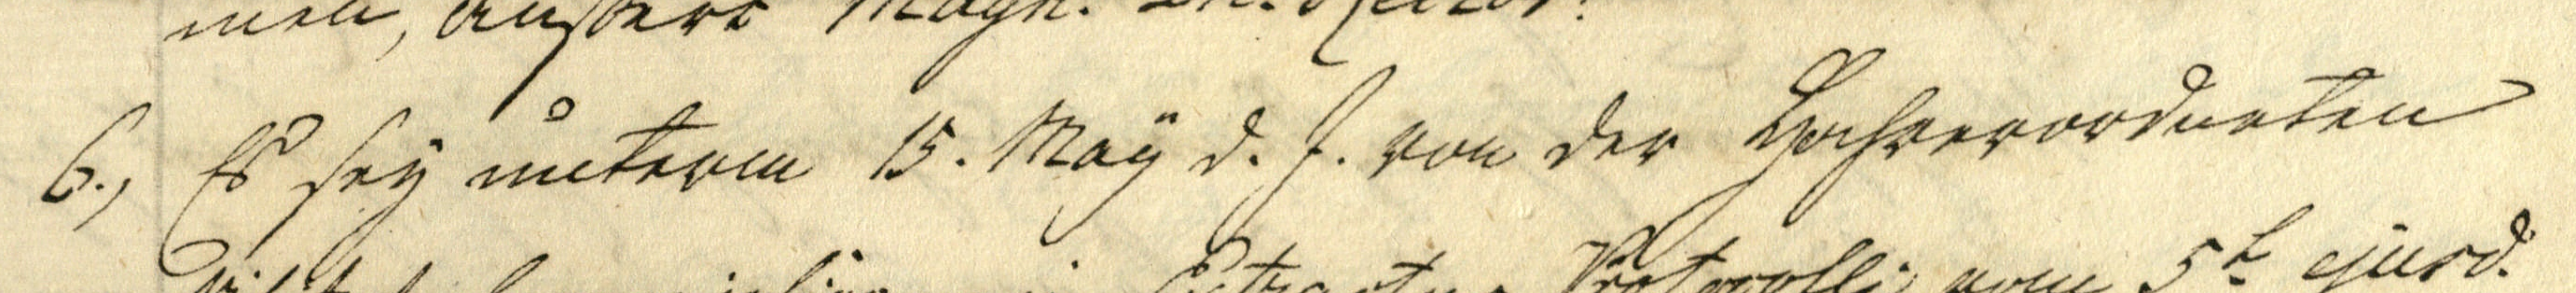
6., Es sey unterm 15. May d. J. von der Hochverordneten
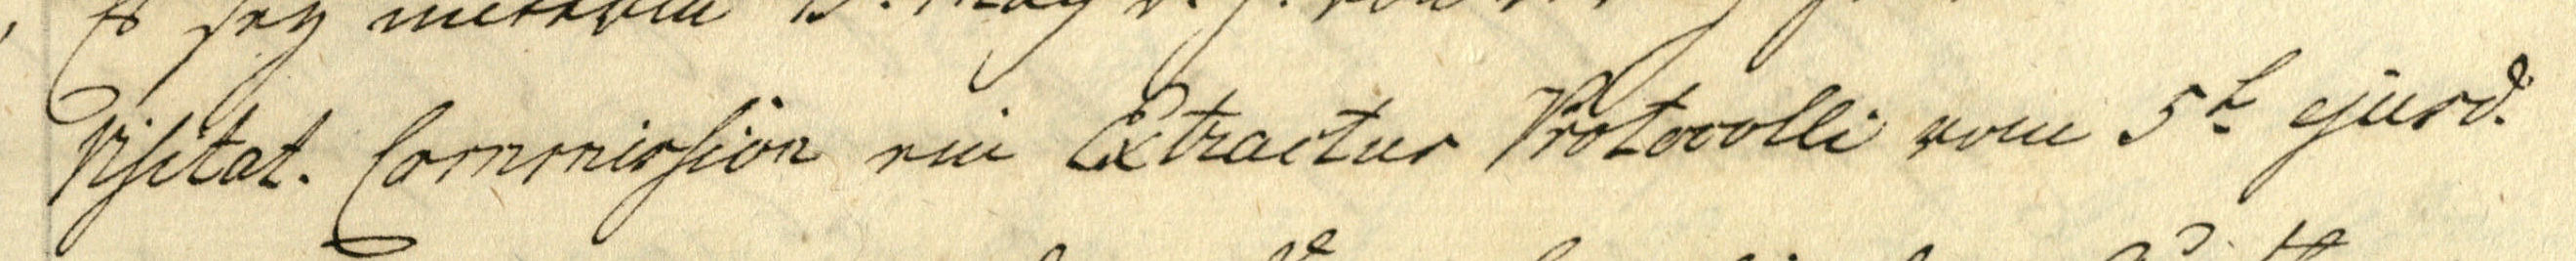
Visitat. Commission ein Extractus Protocolli vom 5t. ejusd.
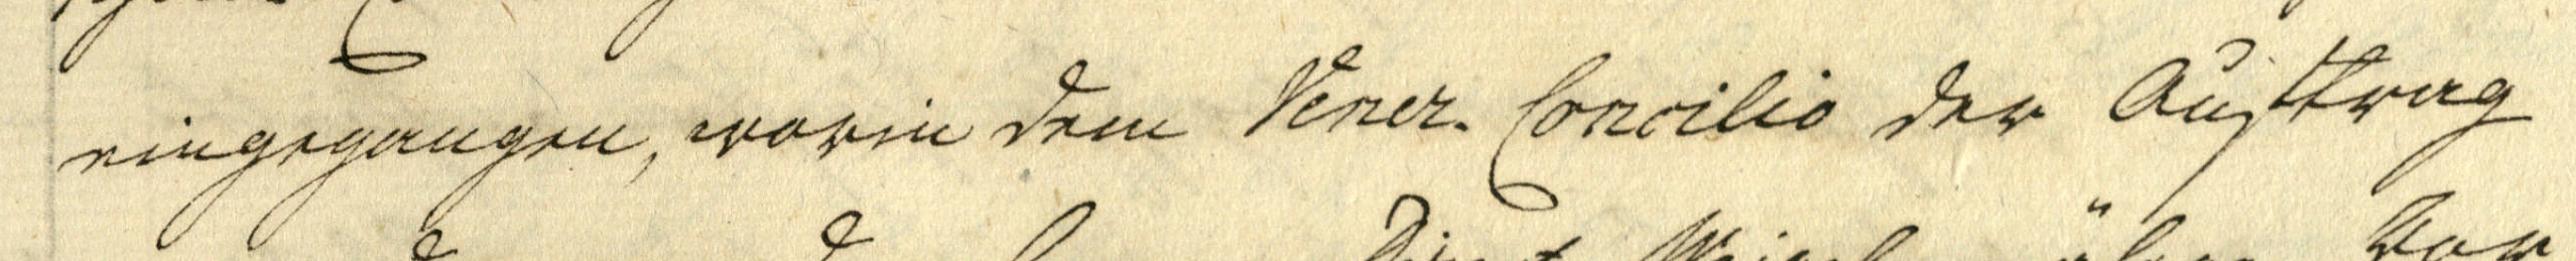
eingegangen, worin dem Vener. Concilio der Auftrag
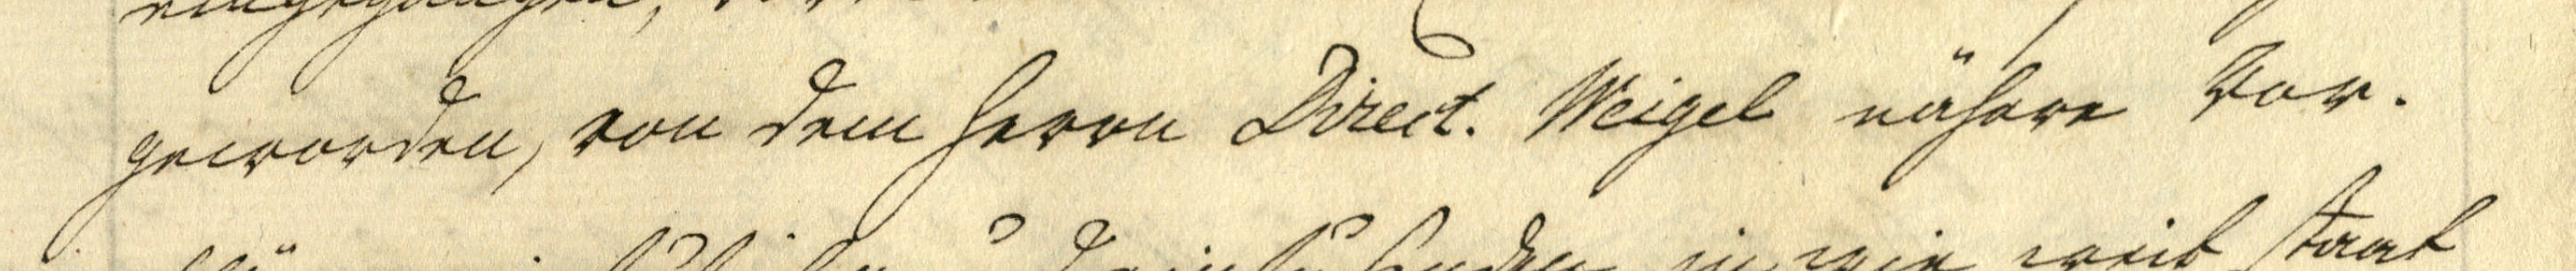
geworden, von dem Herrn Direct. Weigel nähere Vor-
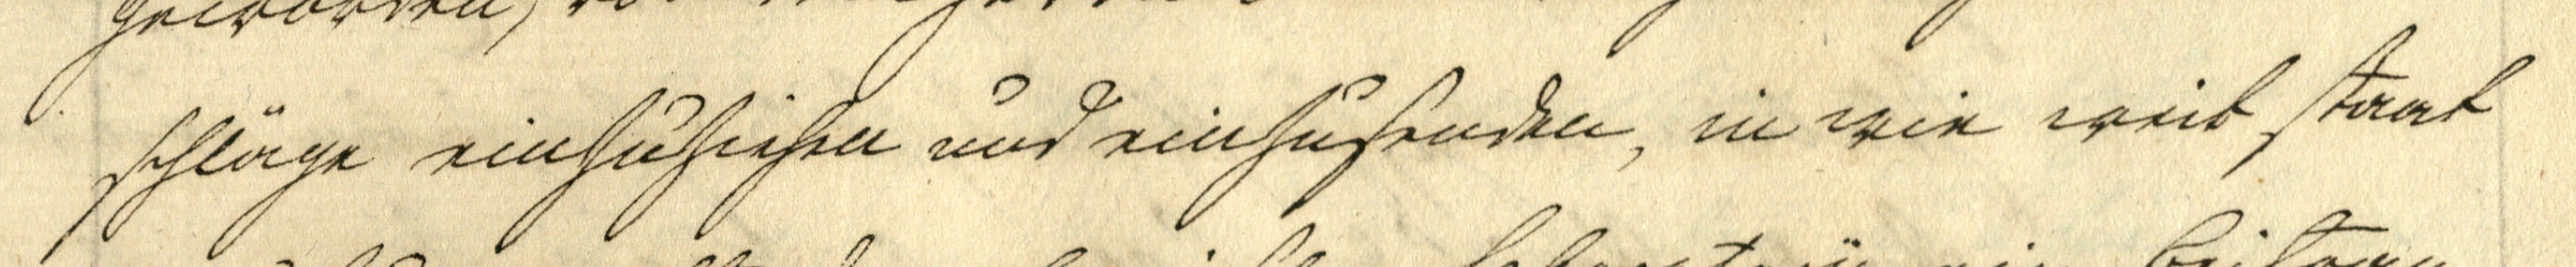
schläge einzuziehen und einzusenden, in wie weit staat
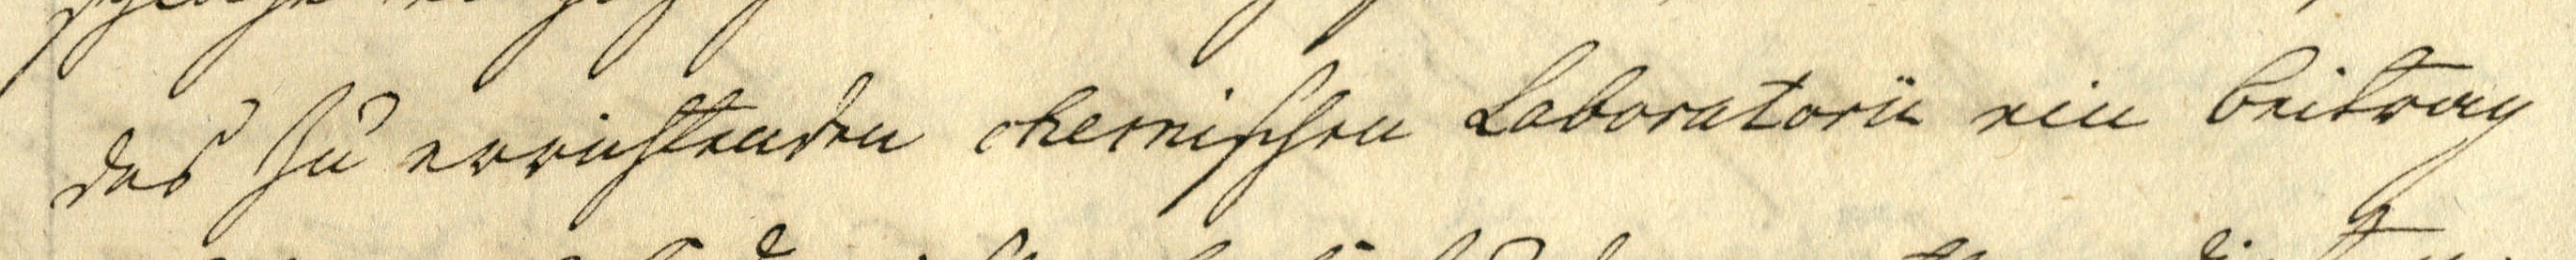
des zu errichtenden chemischen Laboratorii ein Beitrag
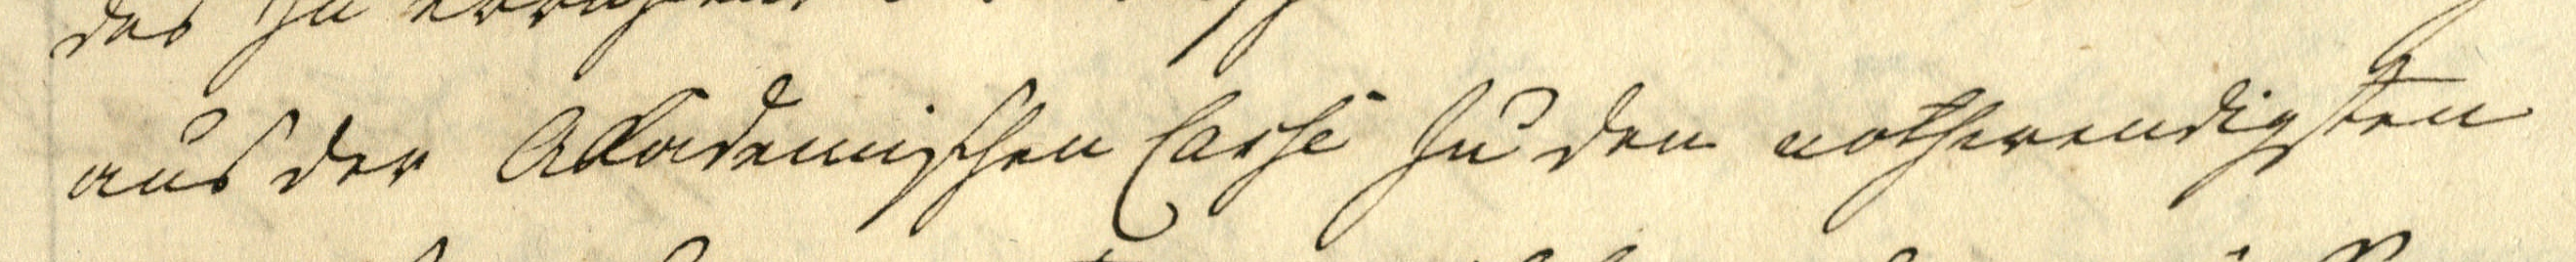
aus der Akademischen Casse zu den nothwendigsten
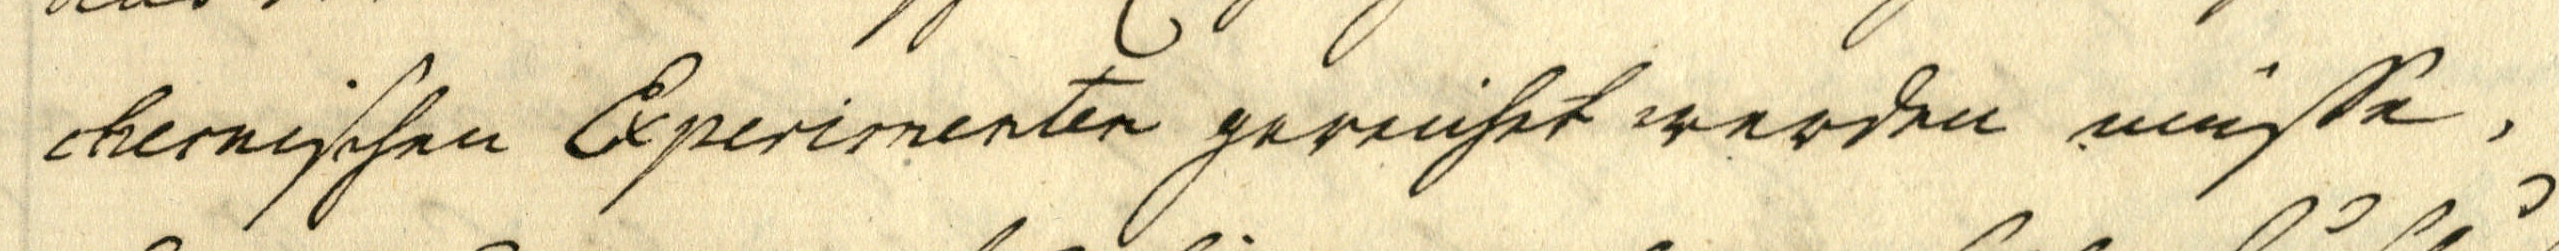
chemischen Experimenten gereichet werden müsse,
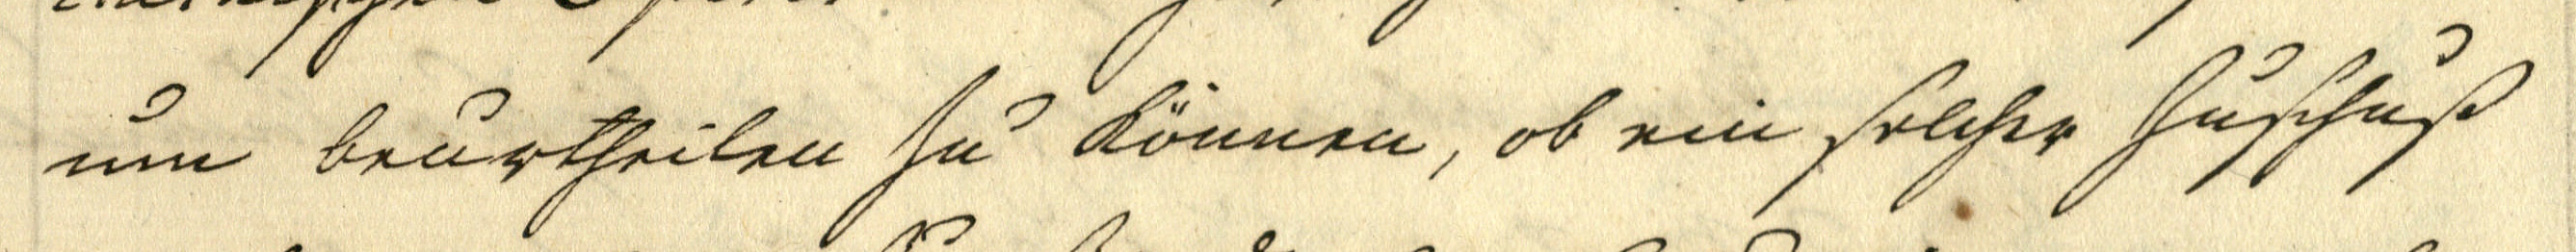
um beurtheilen zu können, ob ein solcher Zuschuß
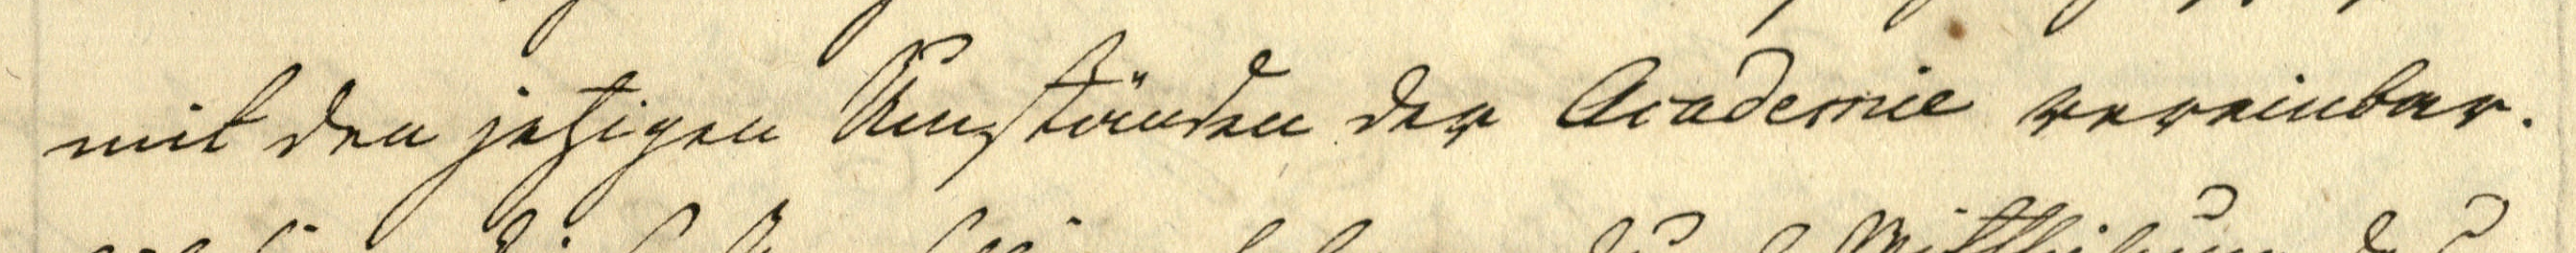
mit den jetzigen Umständen der Academie vereinbar-
